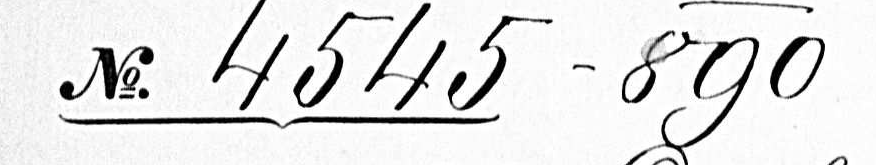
No. 4545 - 890
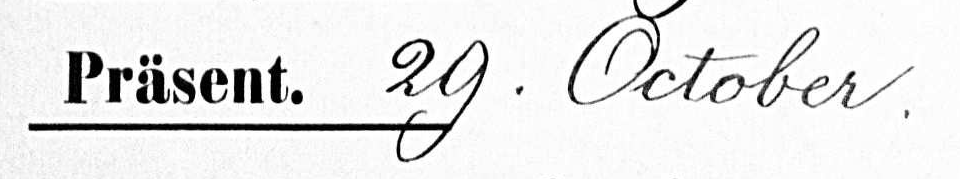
Präsent. 29. October.
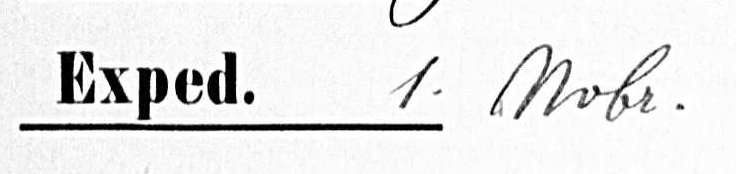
Exped. 1. Nobr.
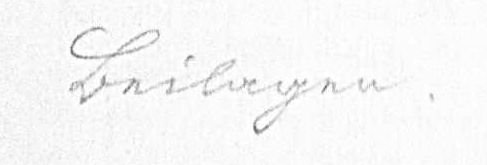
Beilagen.
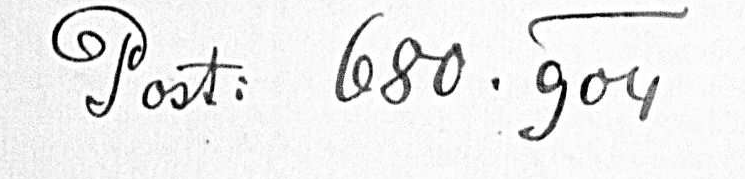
Post: 680. 904
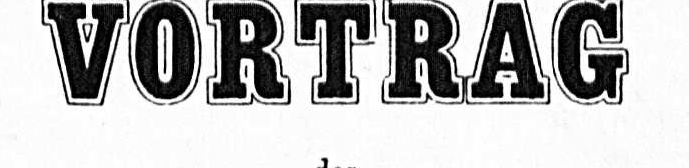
Vortrag
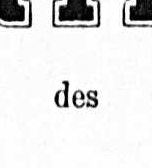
des
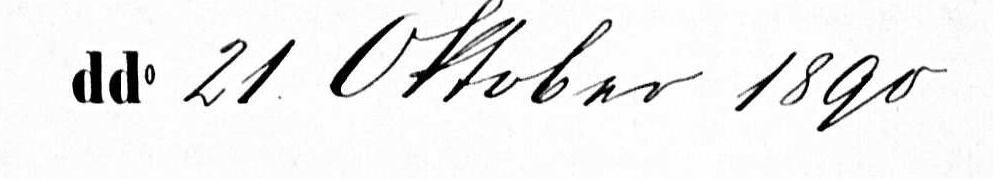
ddo 21. Oktober 1890
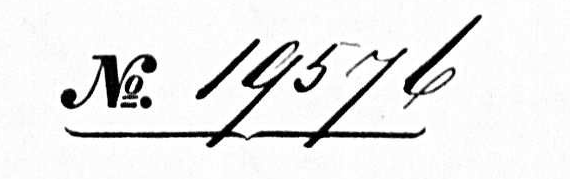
No. 19576
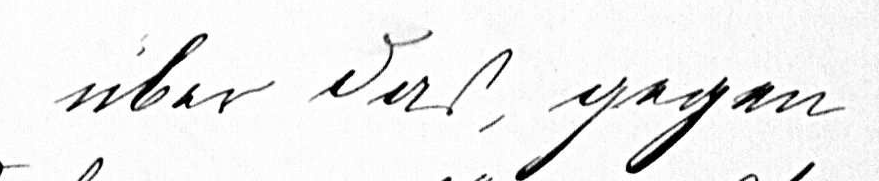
über das, gegen
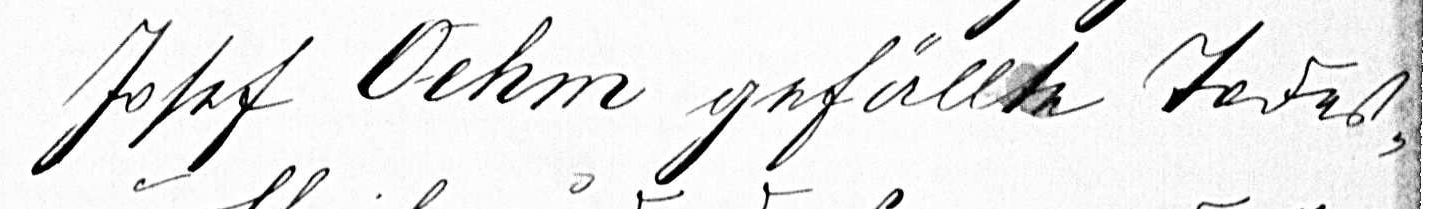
Josef Oehm gefällte Todes¬
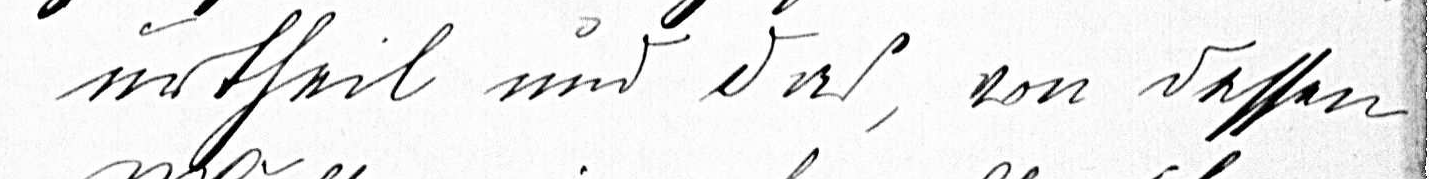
urtheil und das, von dessen
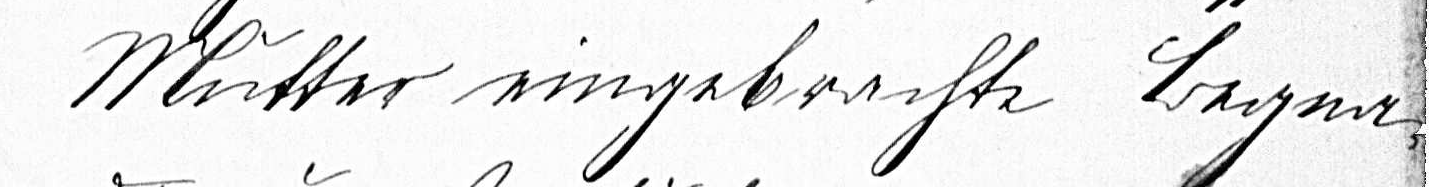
Mutter eingebrachte Begna¬
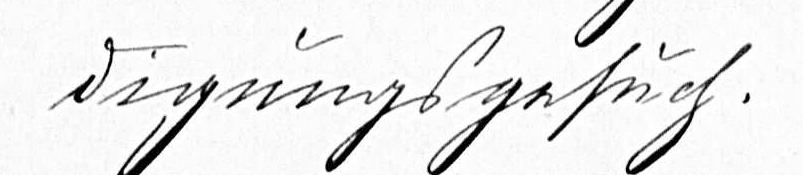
digungsgesuch.
